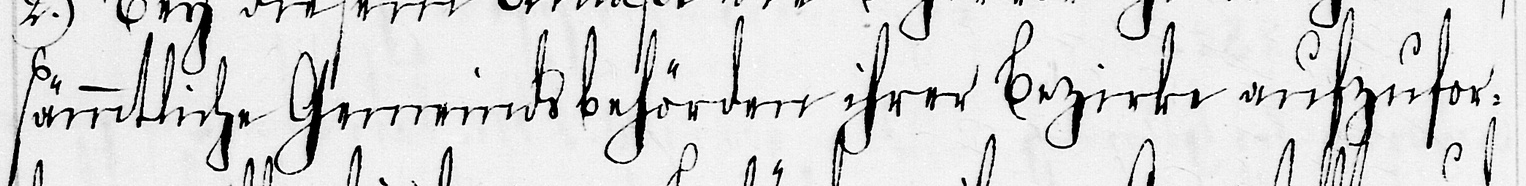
ämmtliche Gemeindsbehörden ihrer Bezirke aufzufor¬
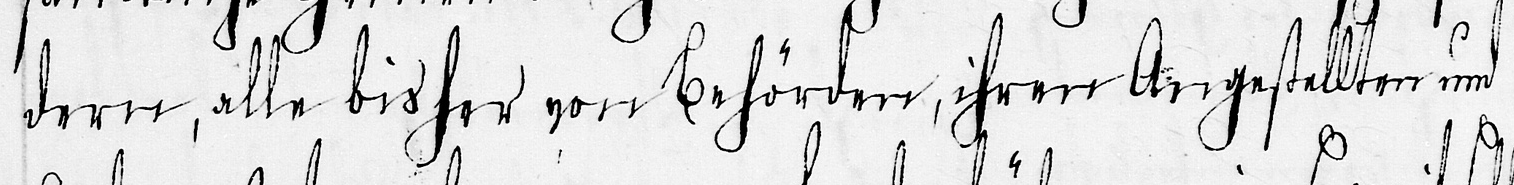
dern, alle bisher von Behörden, ihren Angestellten und
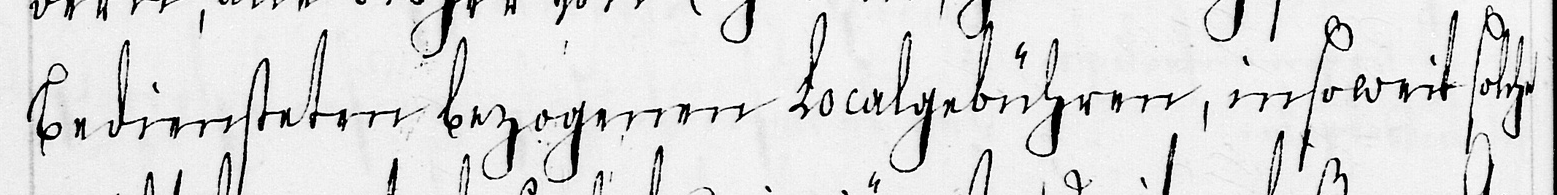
Bediensteten bezogenen Localgebühren, insoweit sol¬
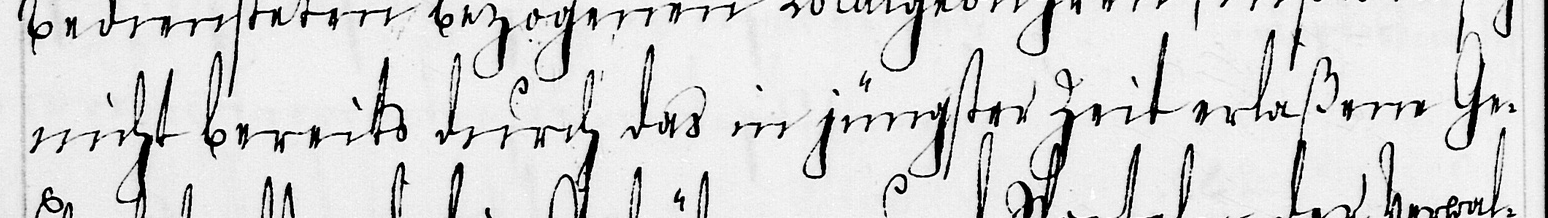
nicht bereits durch das in jüngster Zeit erlaßene Ge¬
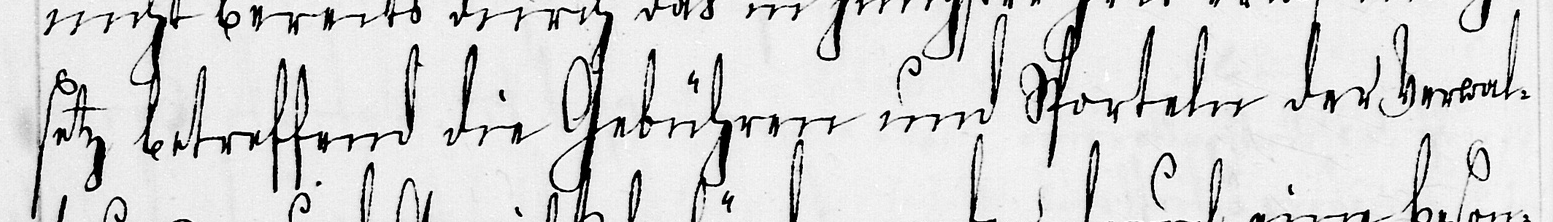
setz betreffend die Gebühren und Sporteln der Verwal¬
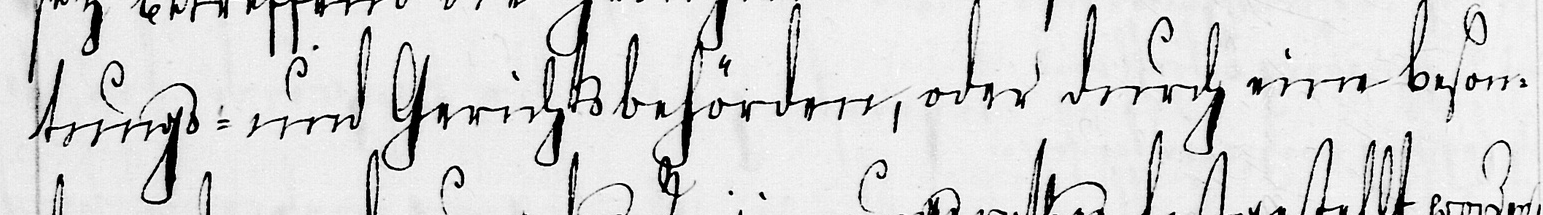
tungs- und Gerichtsbehörden, oder durch eine beson¬
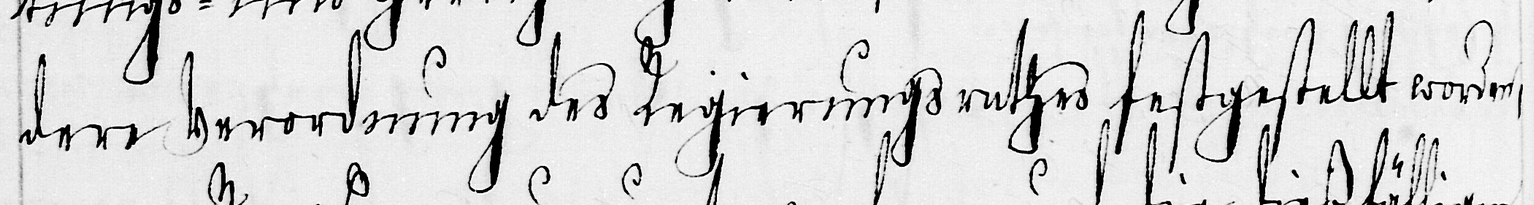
dere Verordnung des Regierungsrathes festgestellt wor¬
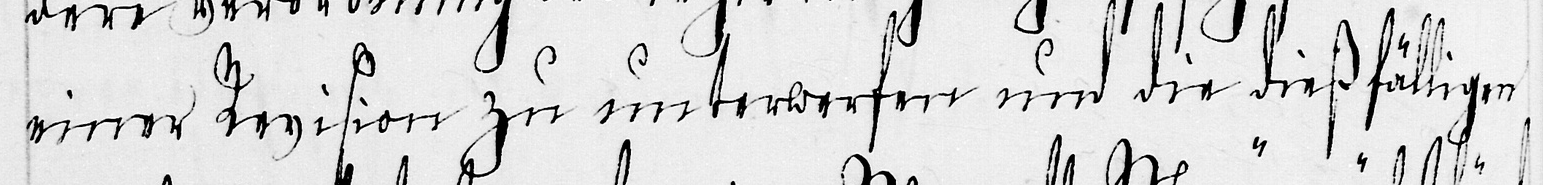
einer Revision zu unterwerfen und die dießfälligen
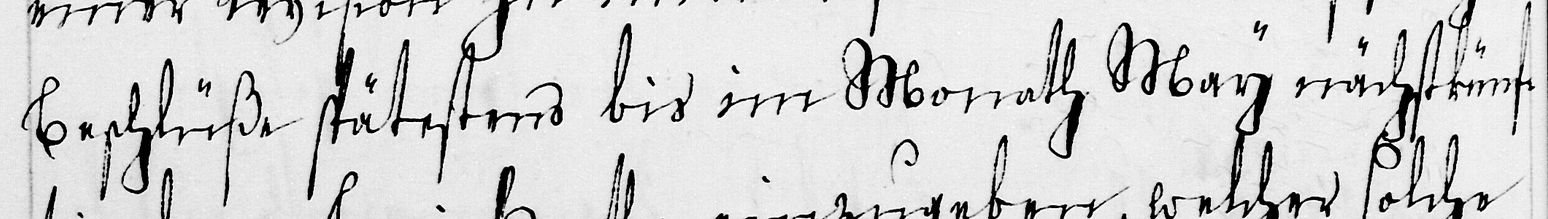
Beschlüße spätestens bis im Monath März nächstkünf¬
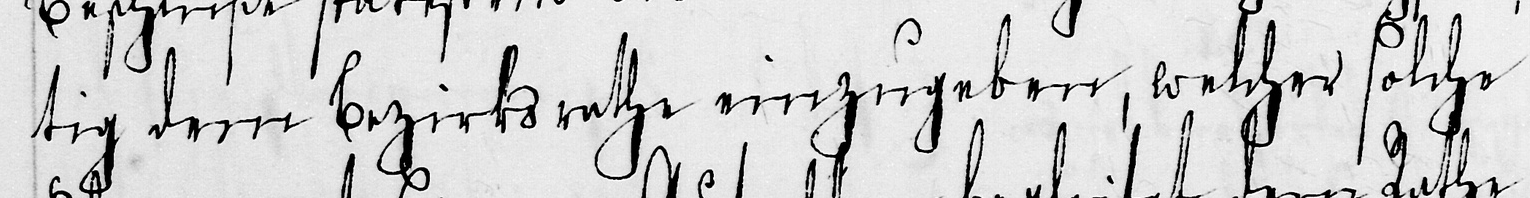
tig dem Bezirksrathe einzugeben, welcher solche
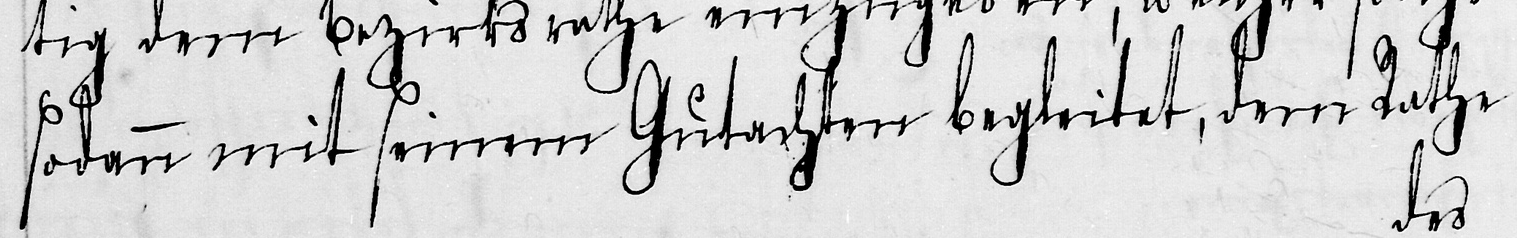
sodann mit seinem Gutachten begleitet, dem Rathe
